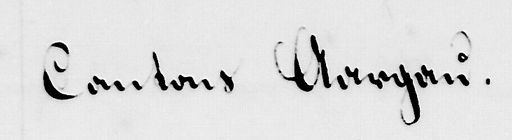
Cantons Aargau.
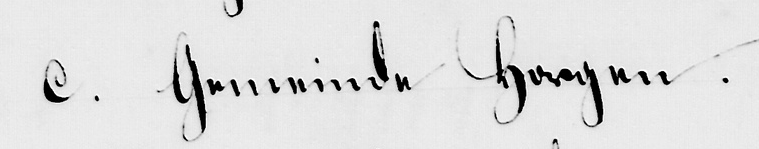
c. Gemeinde Horgen.
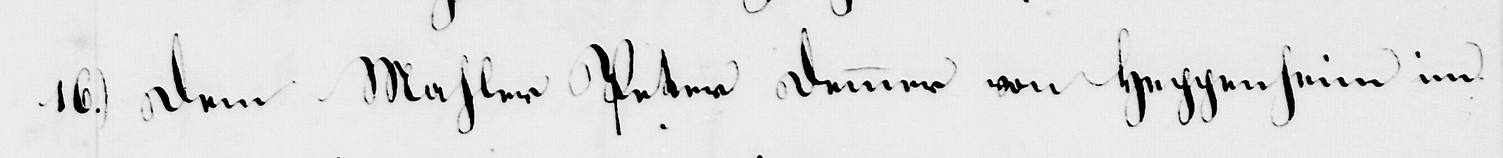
16.) den Mahler Peter Demmer von Heppenheim im
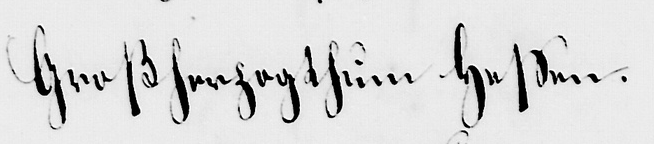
Großherzogtum Heßen.
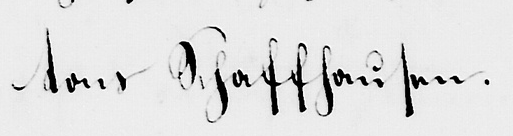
tons Schaffhausen.
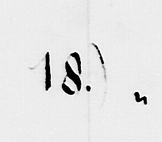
18.)
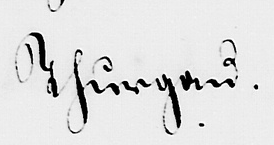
Thurgau.
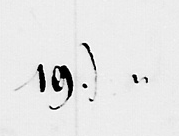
19.)
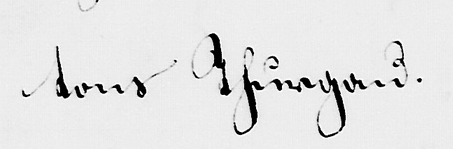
tons Thurgau.
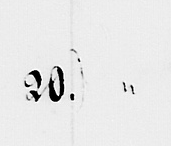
20.)
